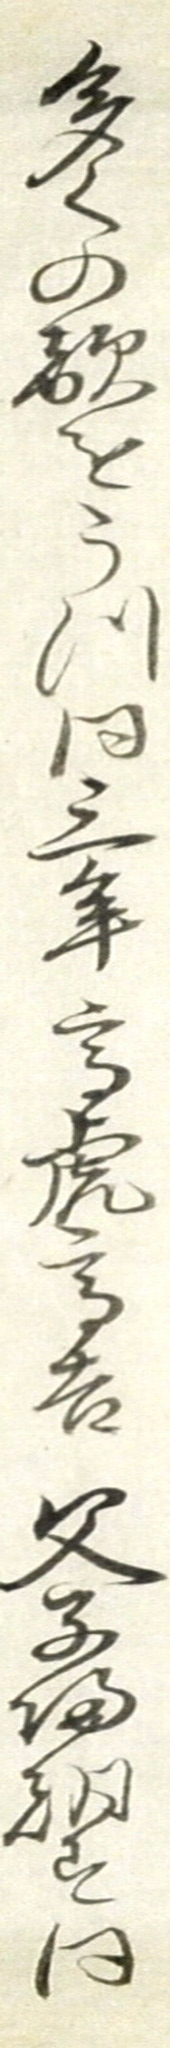多くの敵をうつ同三年高虎高吉父子帰朝す同
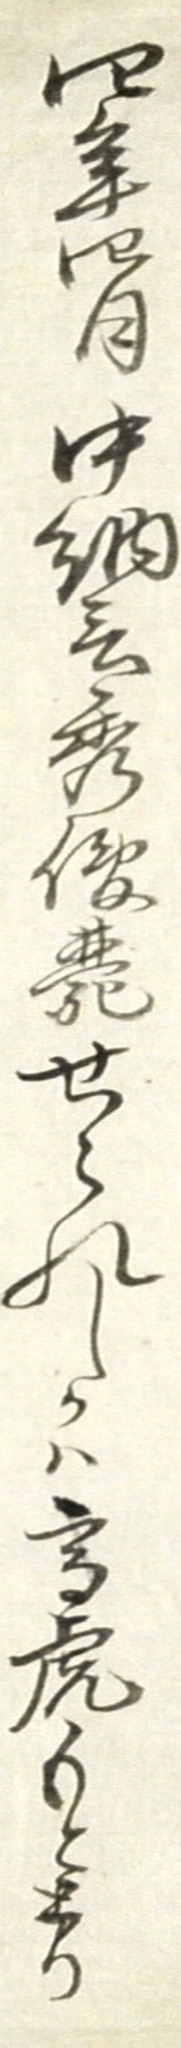四年四月中納言秀俊薨せられしかは高虎もととり
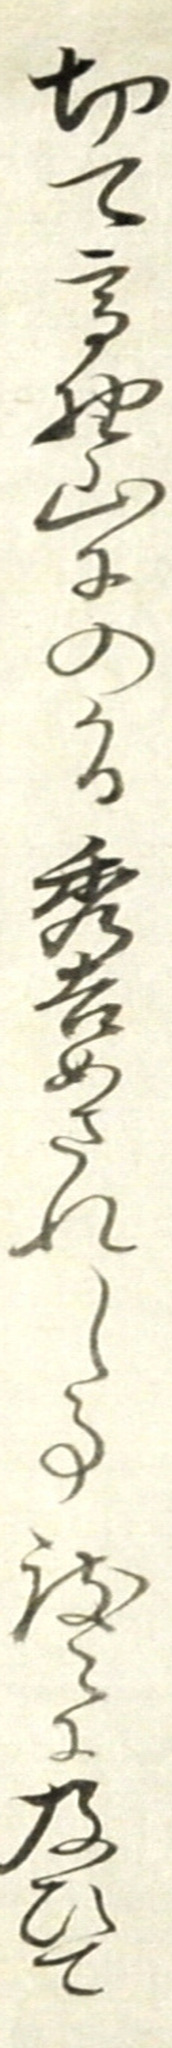切て高野山にのかる秀吉めされし事度々に及ひて

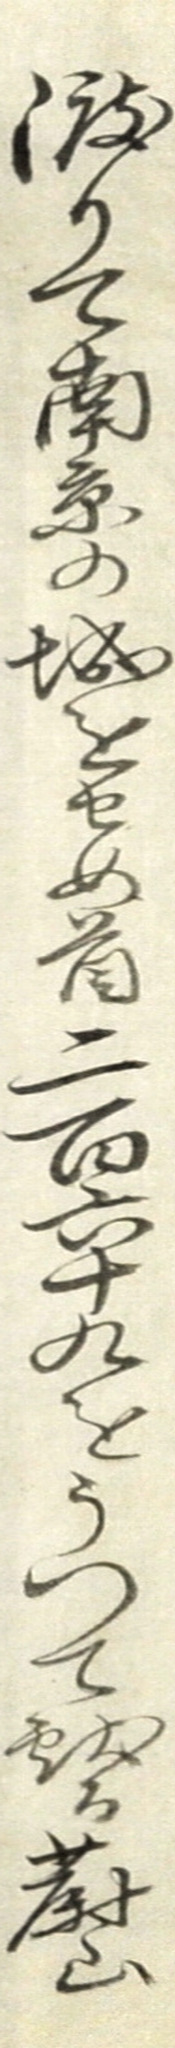渡りて南京の城をせめ首二百六十九をうつて献る蔚山
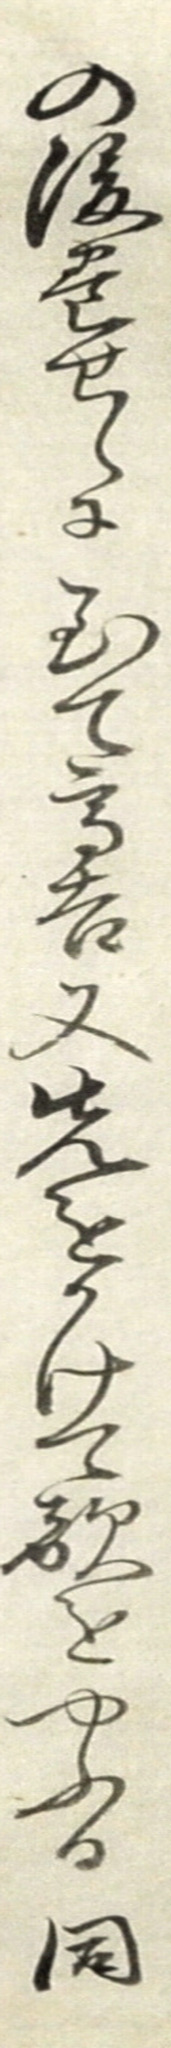の後巻せしに至て高吉又先をかけて敵をやふる同
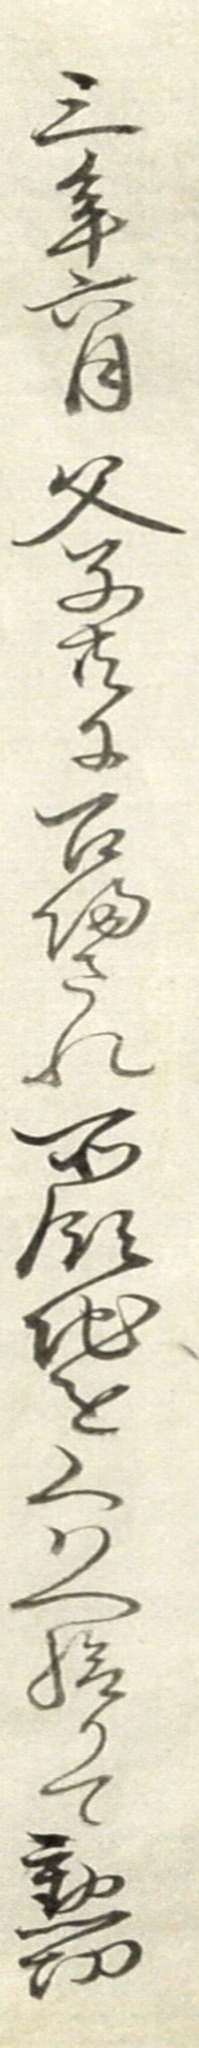三年六月父子共に召帰され所領地をくはへ給りて勲功
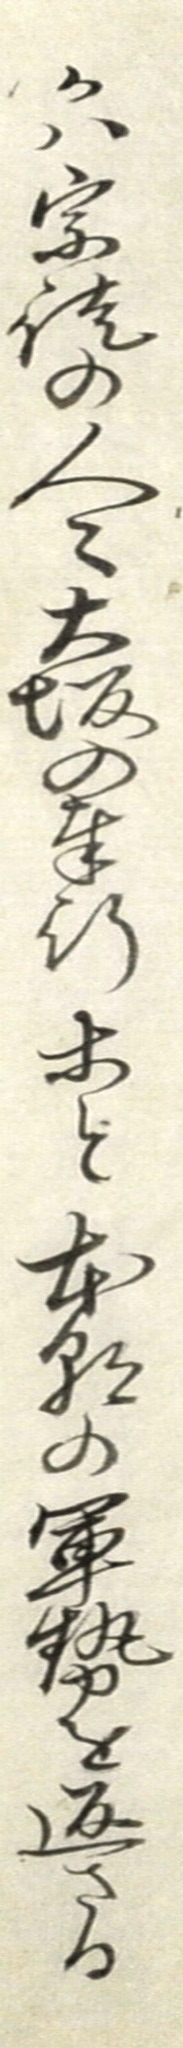かは宗徒の人々大坂の奉行等と本領の軍勢を返さる
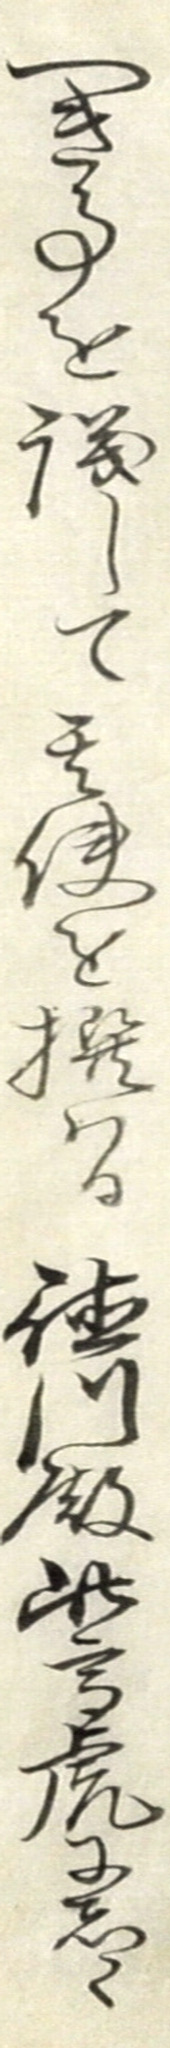へき事を議して其使を撰はる徳川殿此高虎にしく
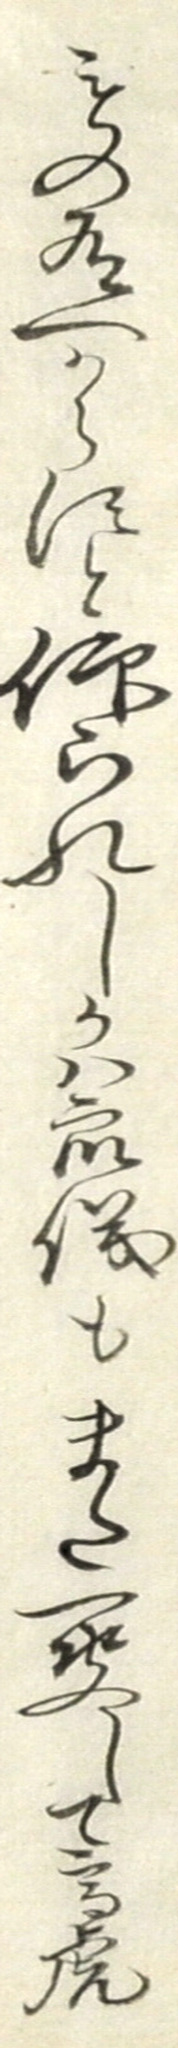もの有へからすと仰られしかは衆議もまた一決して高虎
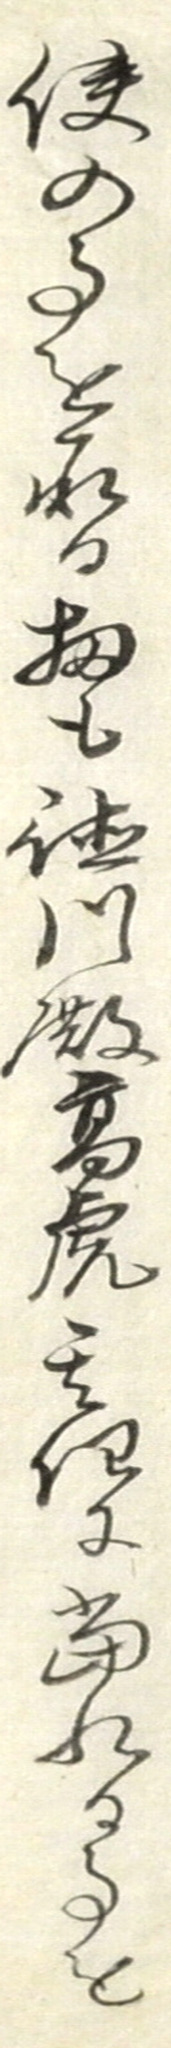使の事を承る扨も徳川殿高虎其任に当れる事を
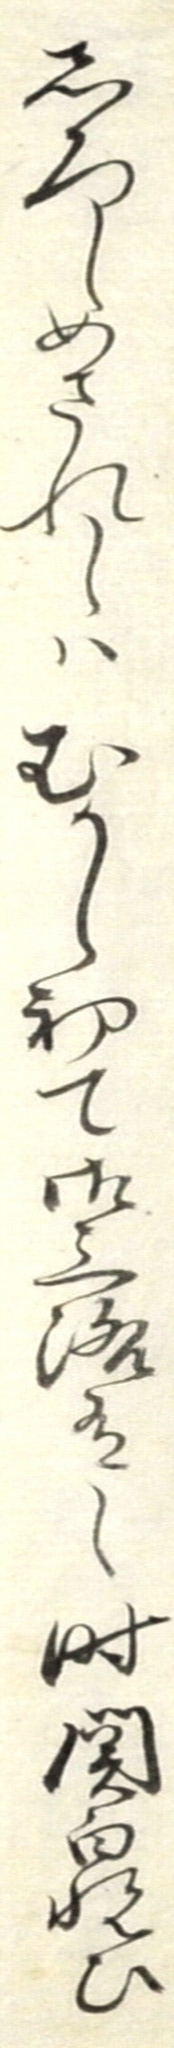しろしめされしはむかし初て御上洛有し時関白悦ひ
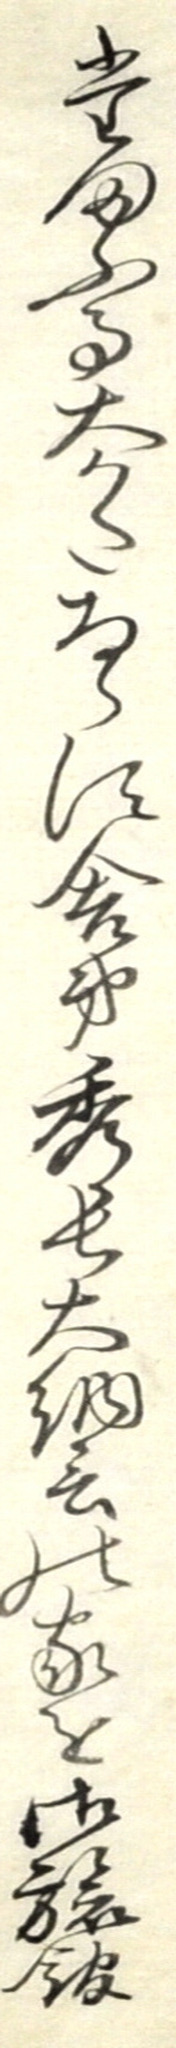たまふ事大かたならす舎弟秀長大納言の家を御旅館
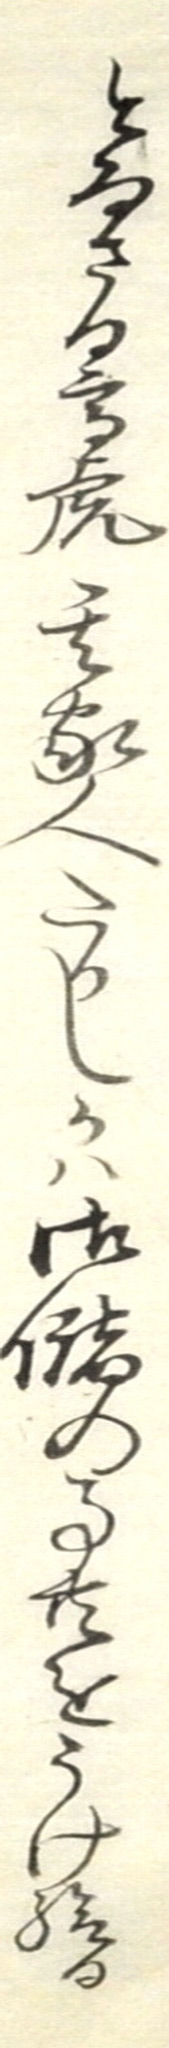となさる高虎其家人たりしかは御儲の事共をうけ給る
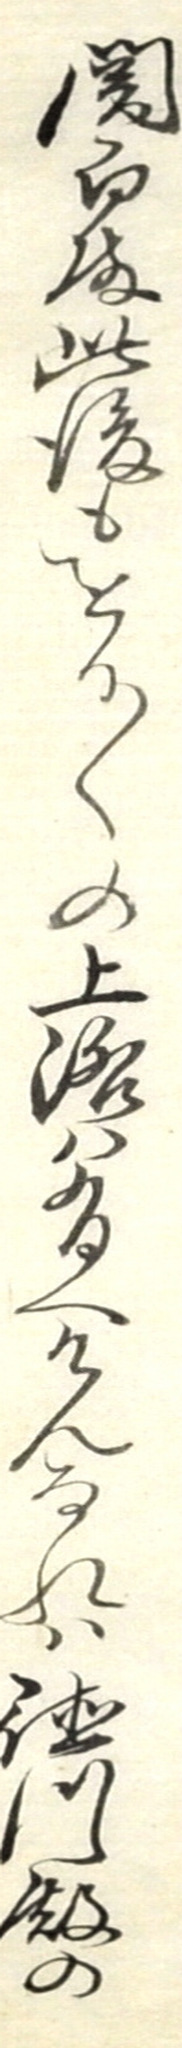関白殿此後もをり〳〵の上洛は有へけんなれは徳川殿の
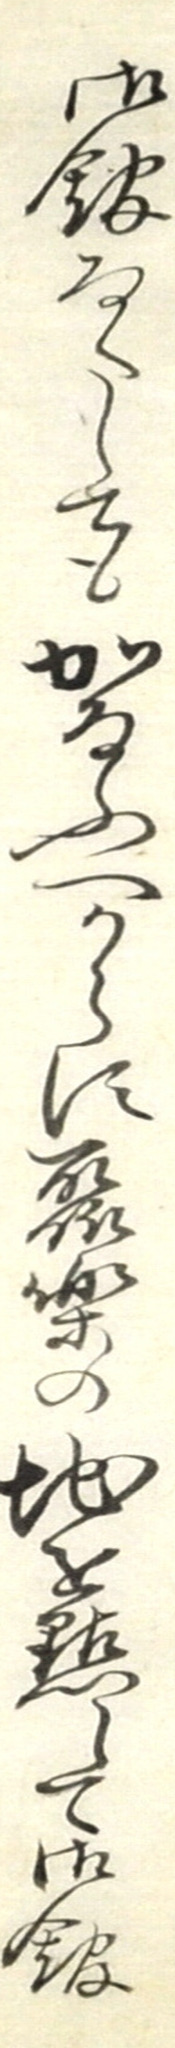御館なくしてもかなふへからす聚楽の地を点して御館
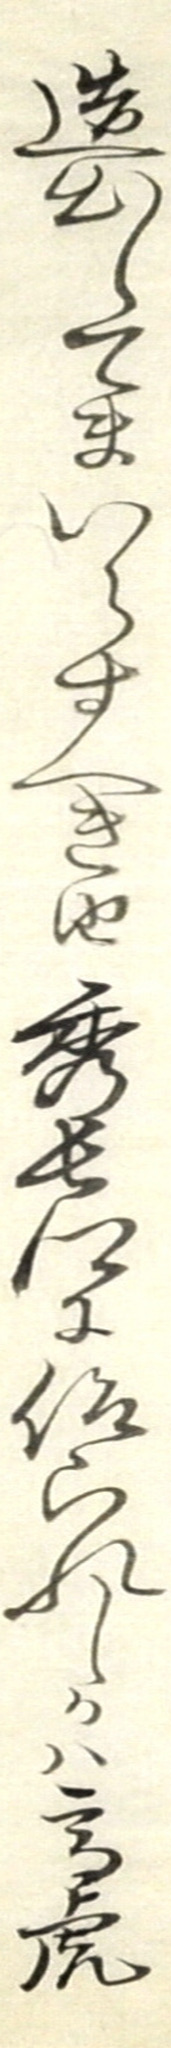造出してまいらすへき也秀長卿に仰られしかは高虎
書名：藩翰譜（七・下）
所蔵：伊那市立高遠町図書館・合同会社AMANE
